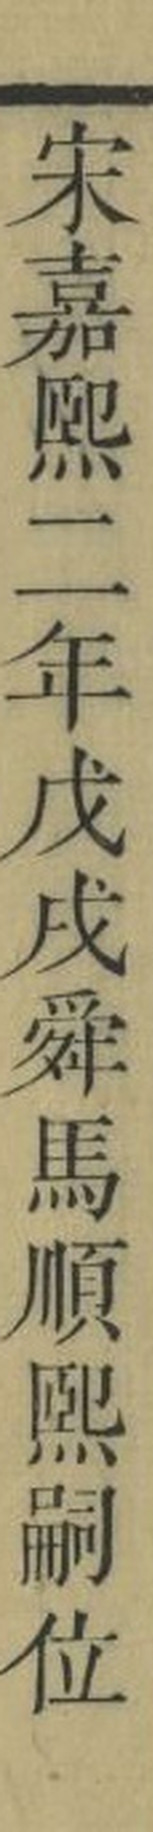宋嘉熙二年戊戌舜馬順熙嗣位
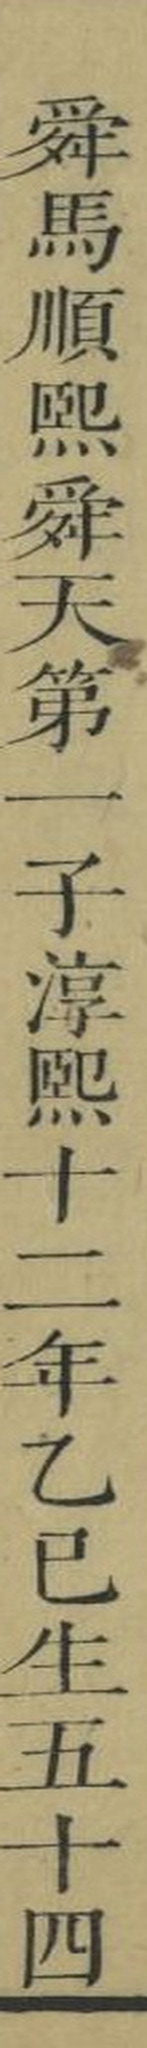舜馬順熙舜天第一子淳熙十二年乙巳生五十四
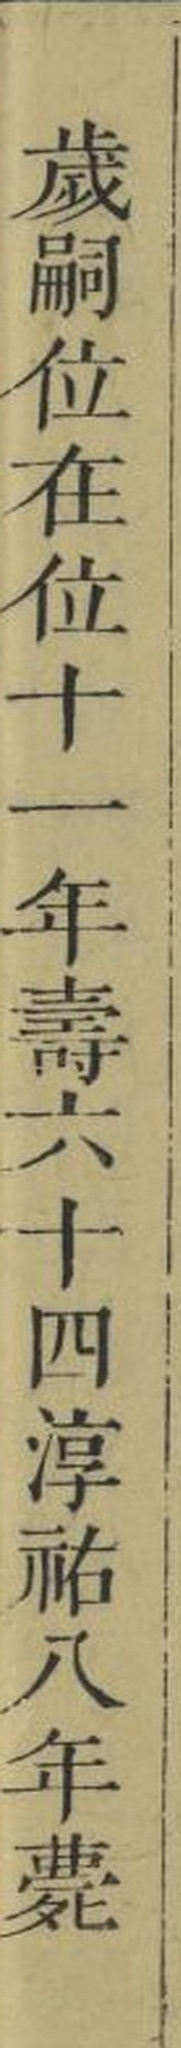歳嗣位在位十一年寿六十四淳祐八年薨
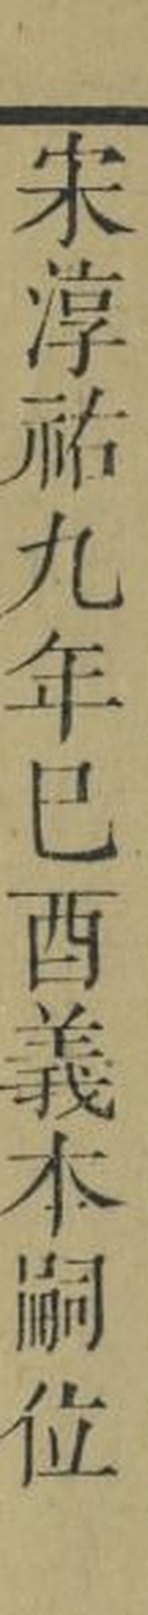宋淳祐九年巳酉義本嗣位
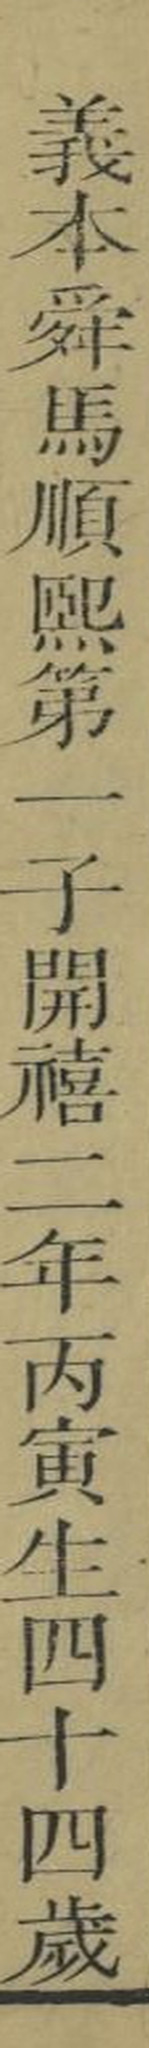義本舜馬順熙第一子開禧二年丙寅生四十四歳
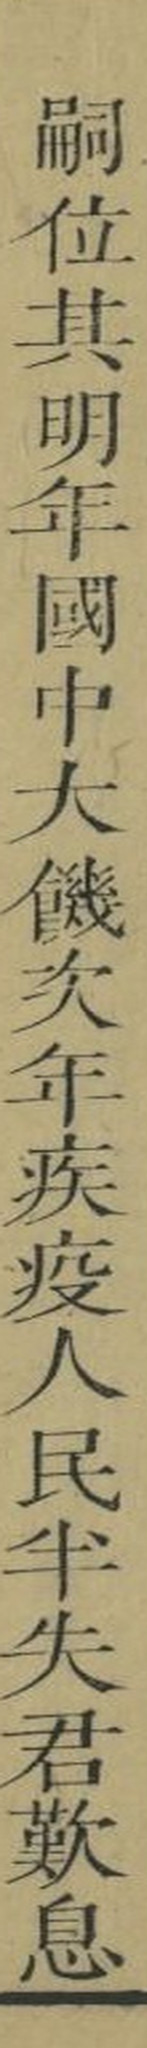嗣位其明年国中大饑次年疾疫人民半失君歎息
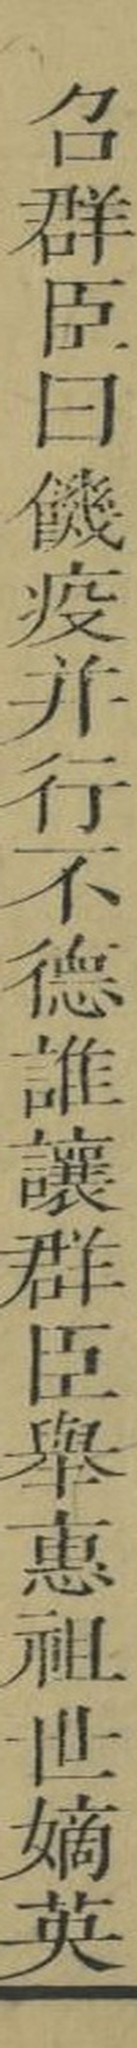召群臣曰饑疫并行不徳誰譲群臣挙恵祖世嫡英
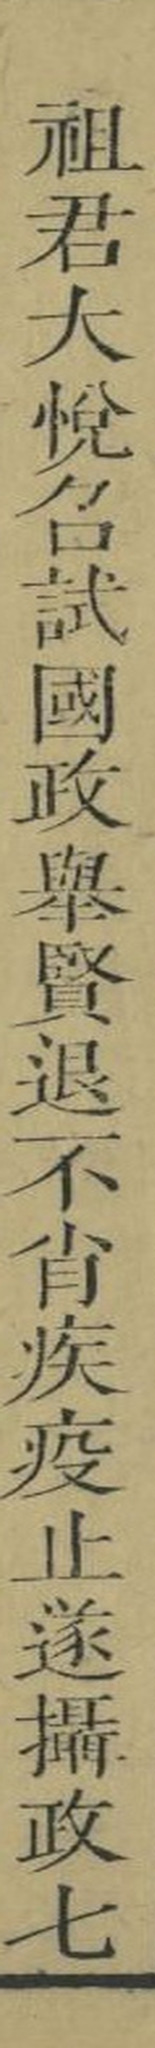祖君大悦召試国政挙賢退不肖疾疫止遂摂政七
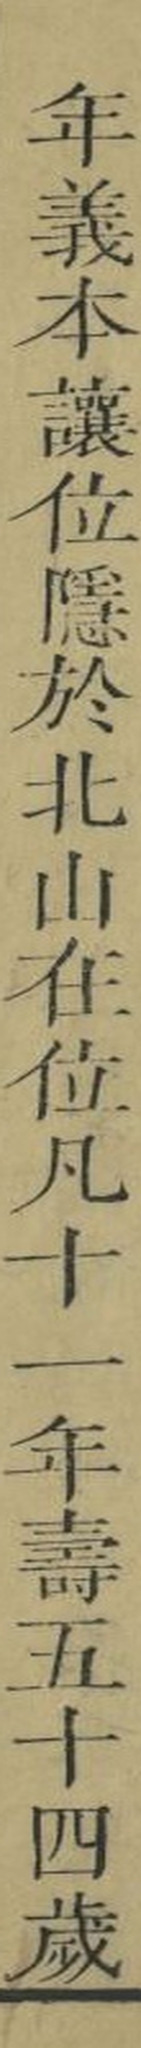年義本譲位隠於北山在位凡十一年寿五十四歳
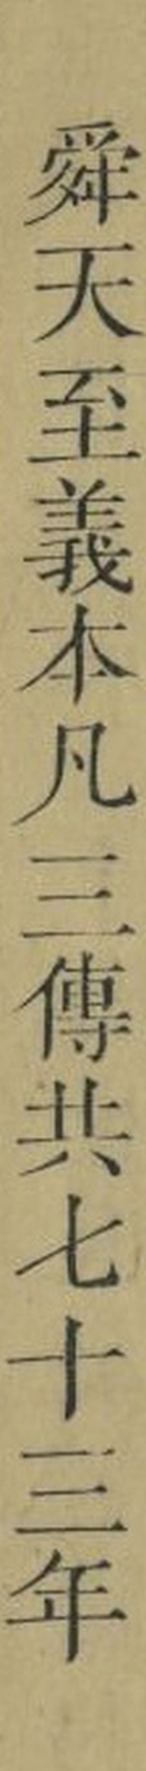舜天至義本凡三伝共七十三年

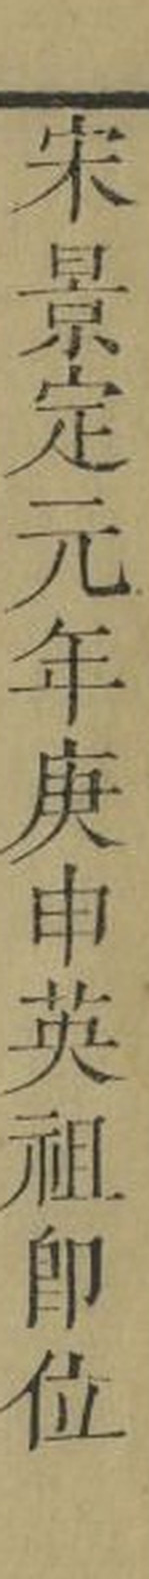宋景定元年庚申英祖即位
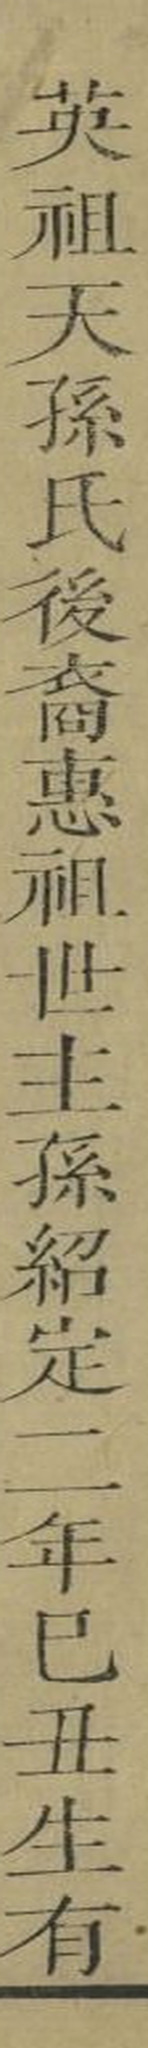英祖天孫氏後裔恵祖世主孫紹定二年巳丑生有
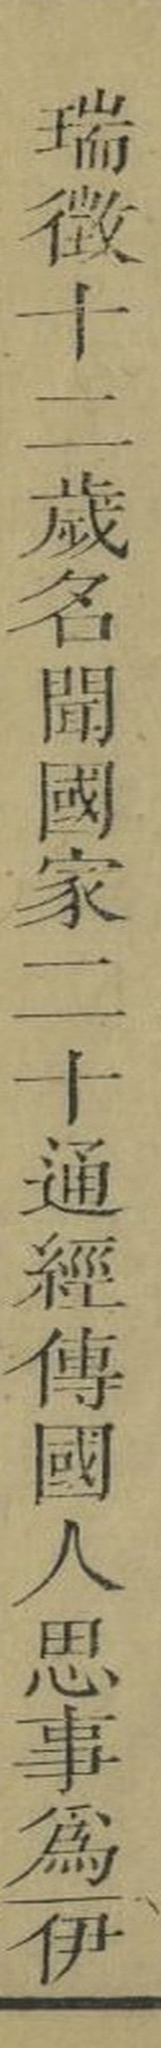瑞徴十二歳名聞国家二十通経伝国人思事為[伊
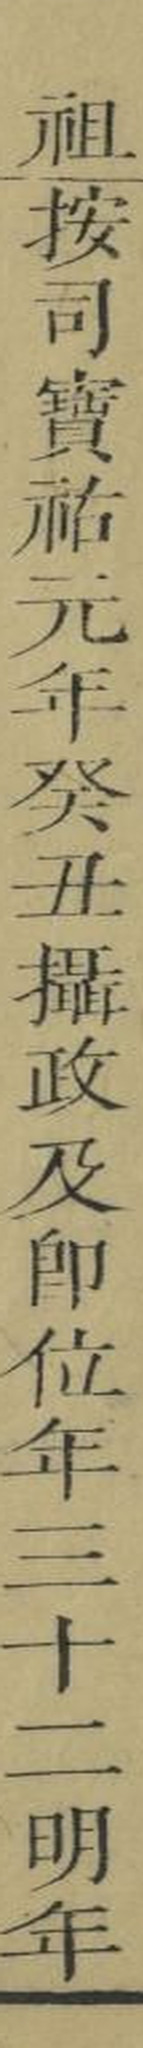祖]按司宝祐元年癸丑摂政及即位年三十二明年
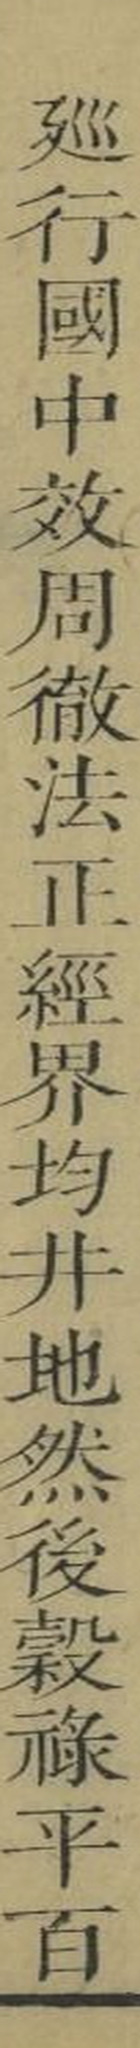巡行国中效周徹法正経界均井地然後穀禄平百
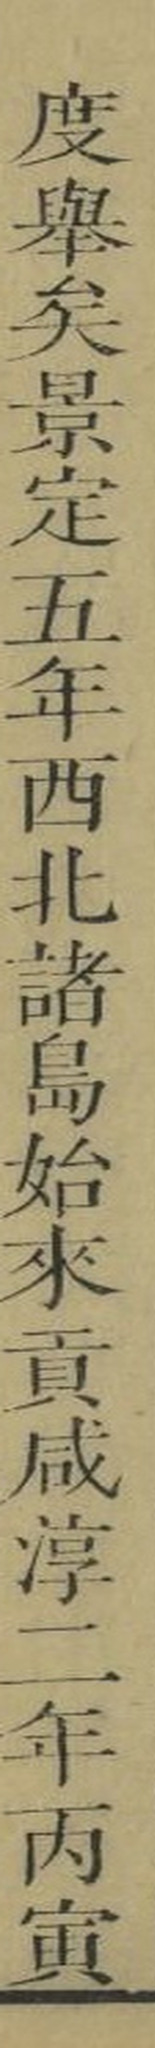度挙矣景定五年西北諸島始来貢咸淳二年丙寅
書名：中山伝信録 巻三
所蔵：University of the Ryukyus Library
